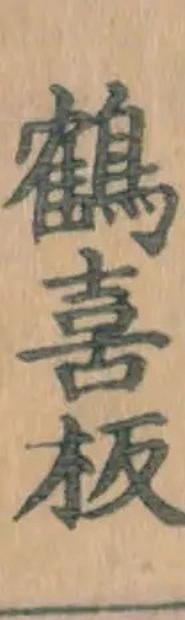鶴喜板
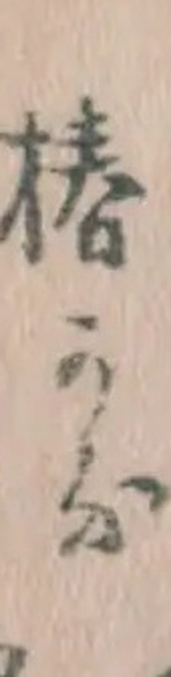椿かな

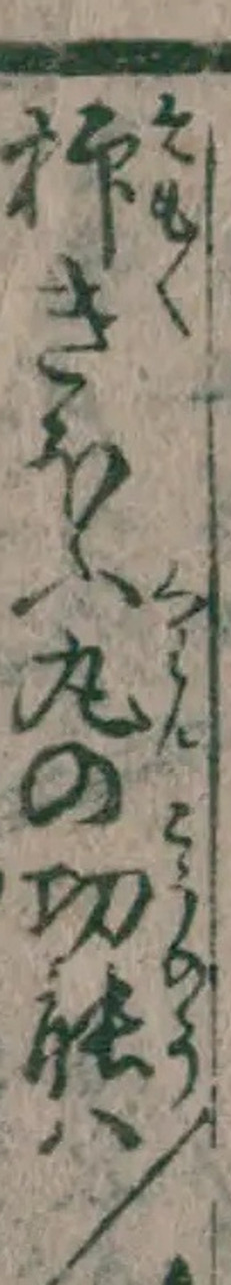抑きほふ丸の功能は
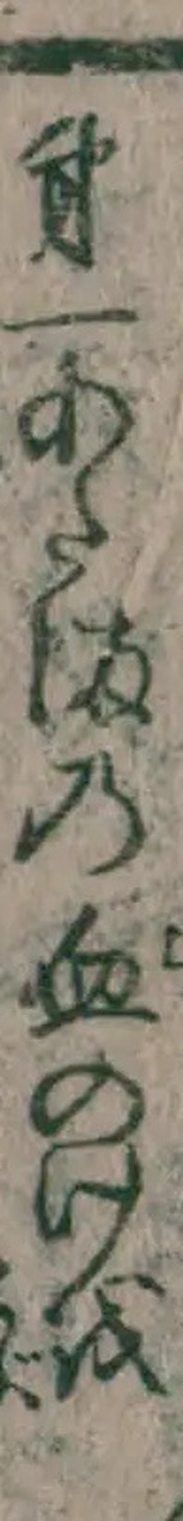第一あたまの血のけを
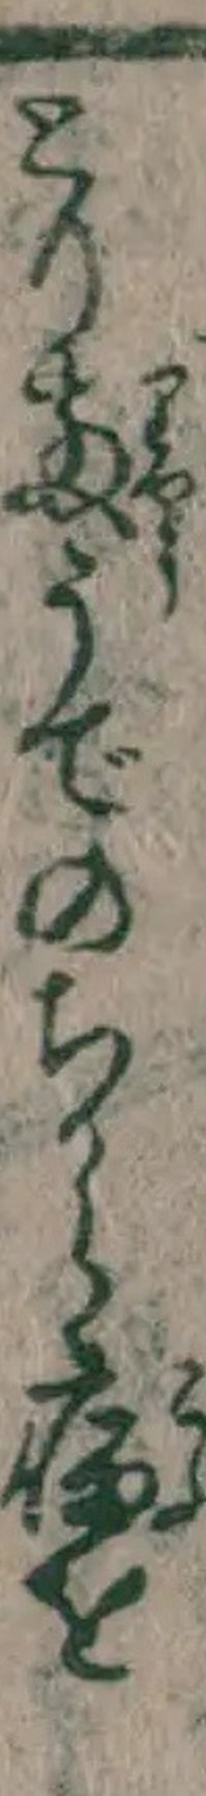とり両うでのちから瘤を
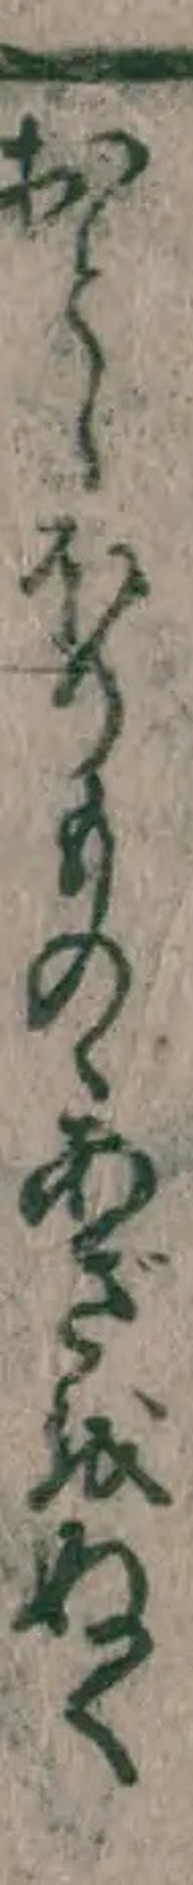おとしほりもののあざをぬく
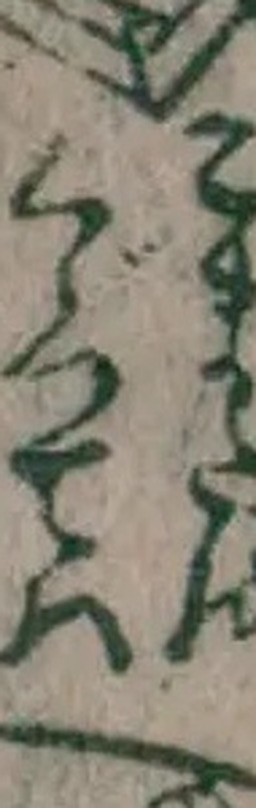くゞつては
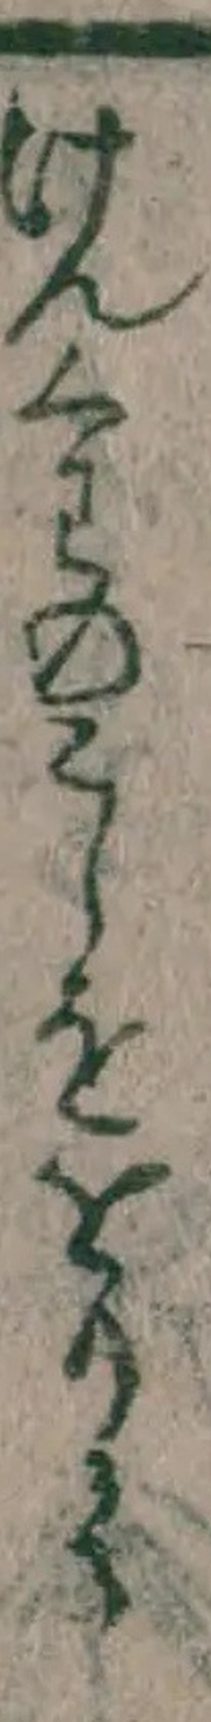けんくわのこしををりて
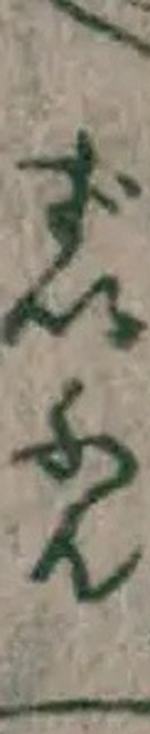ずいふん
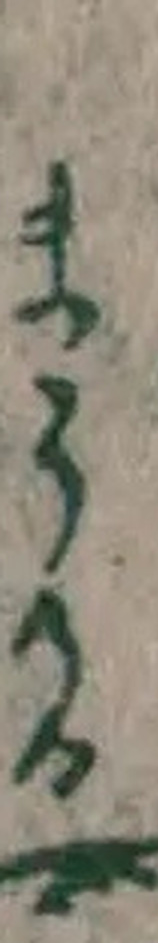まうかる
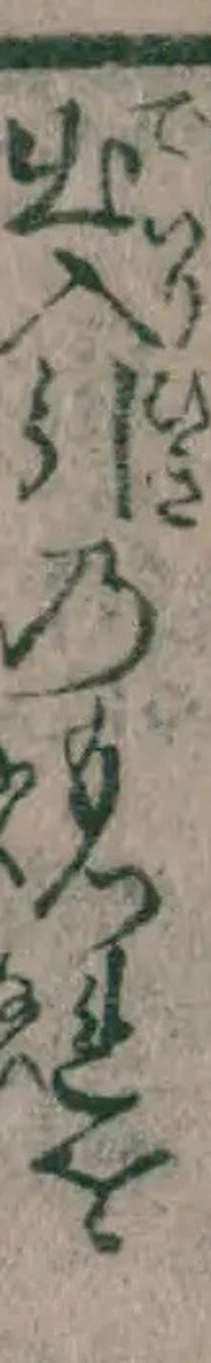出入引のもつれを
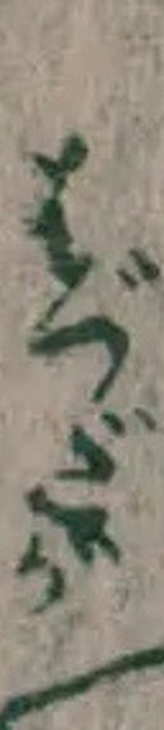はづだが
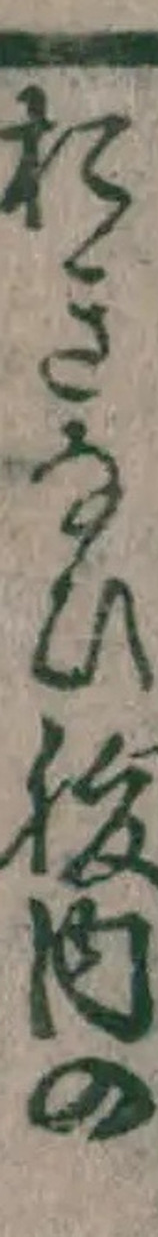おきなひ腹内の
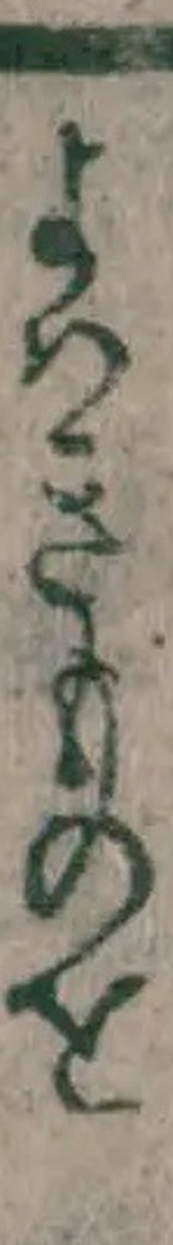よはきものを
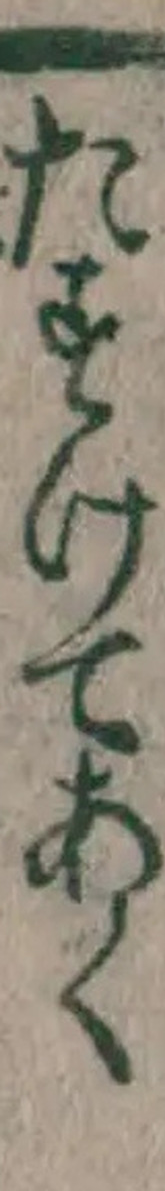たすけてあく
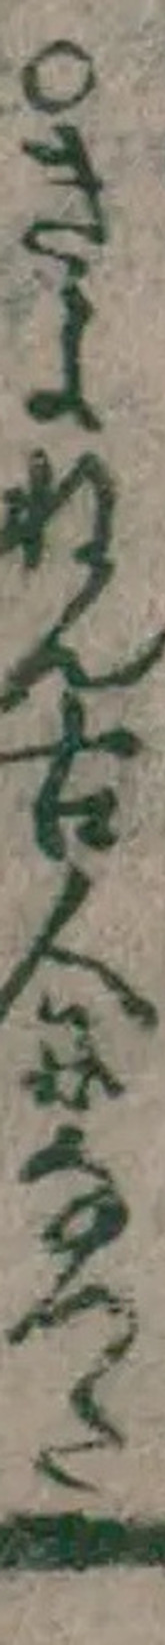◯きよねん古人になつた
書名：視薬霞報条 3巻
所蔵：国立国会図書館 National Diet Library, JAPAN
